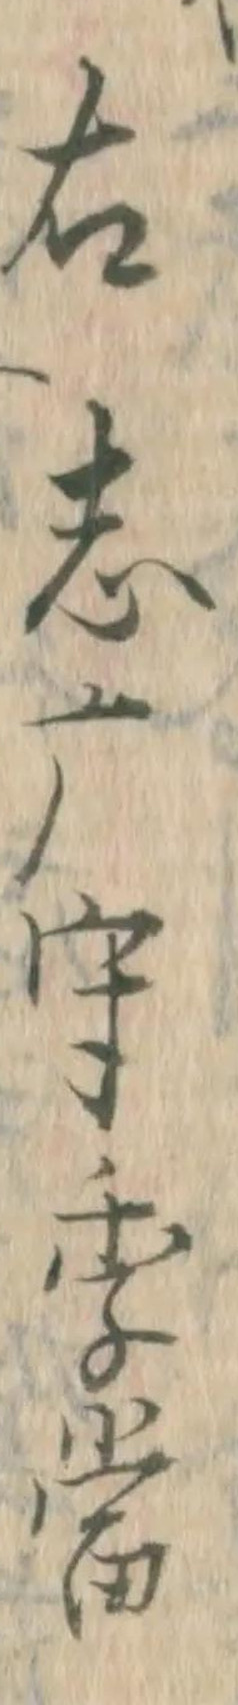右志摩守季当
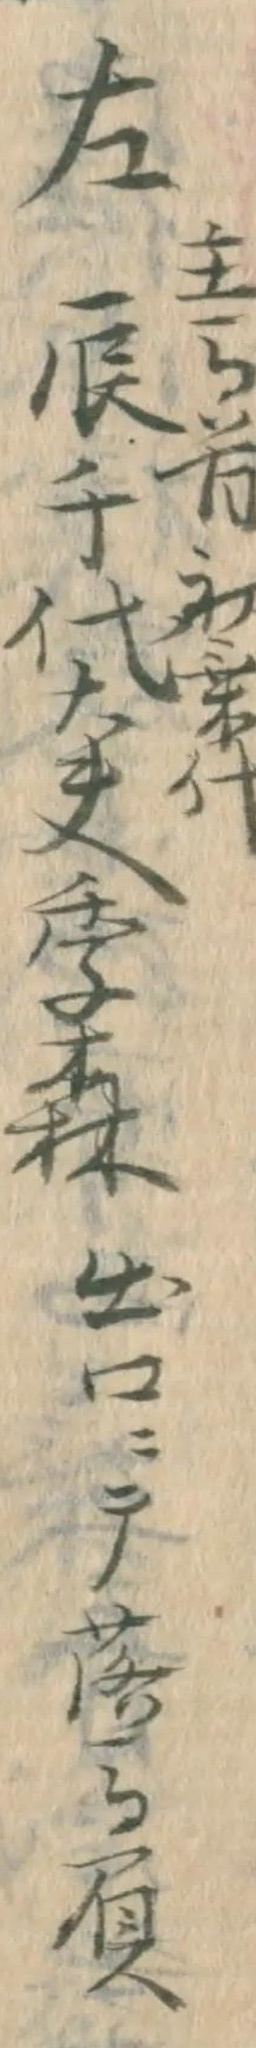左辰千代大夫季森出口ニテ落馬負
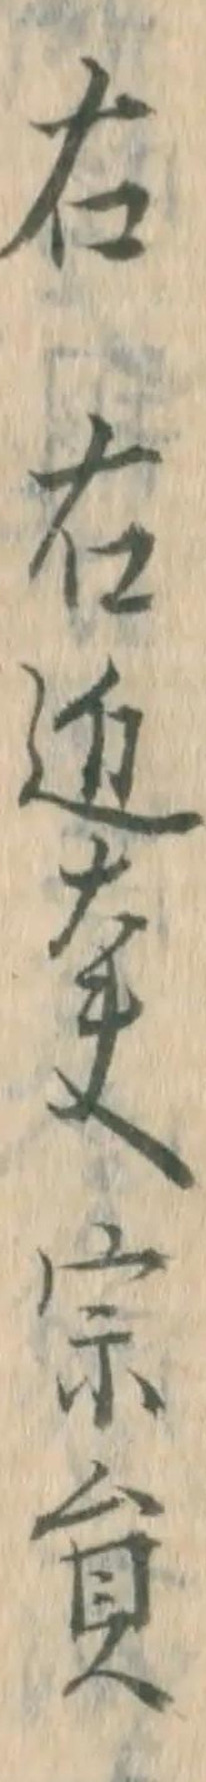右右近大夫宗員

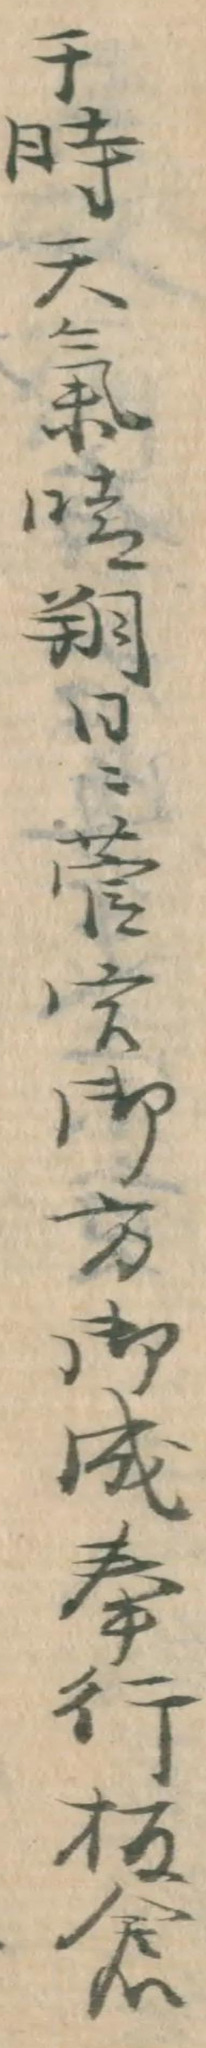于時天気晴朔日ニ菅宮御方御成奉行板倉
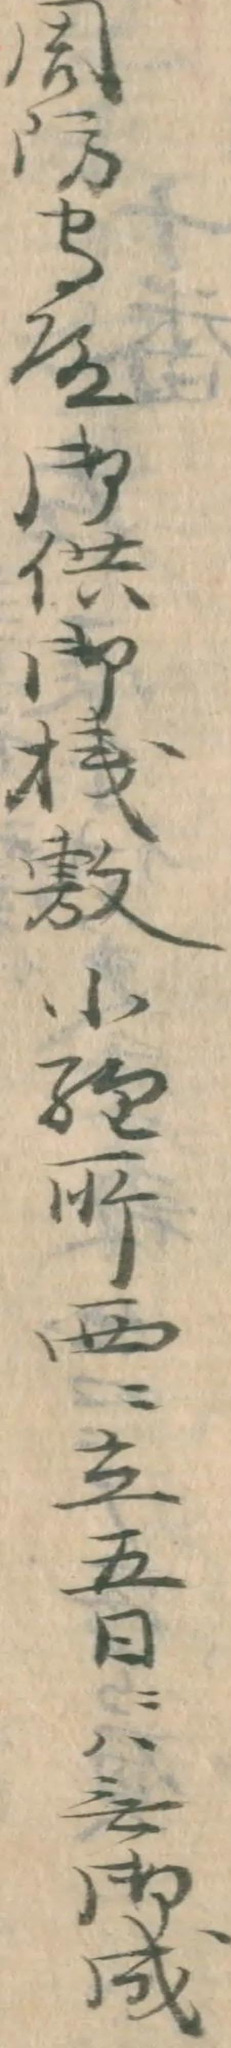周防守殿御供御桟敷小経所西ニ立五日ニハ無御成
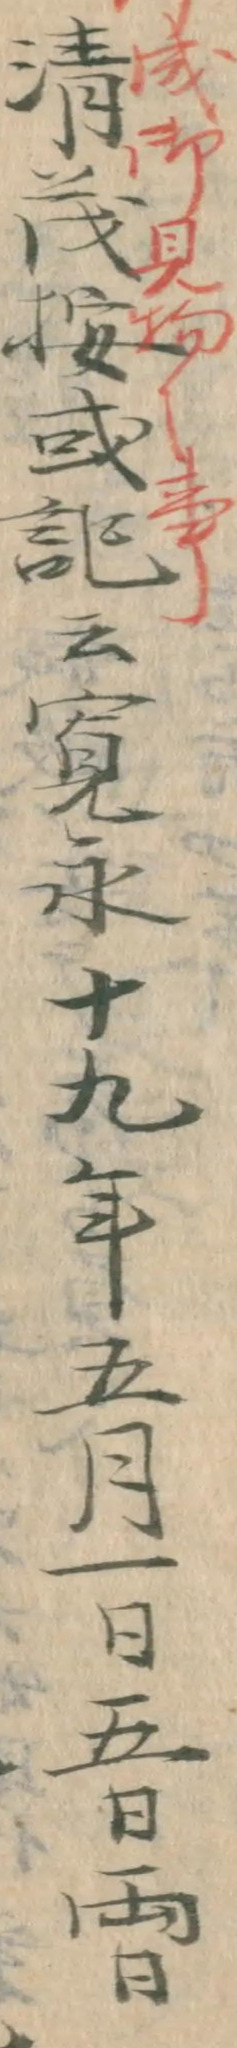清茂按或記云寛永十九年五月一日五日両日
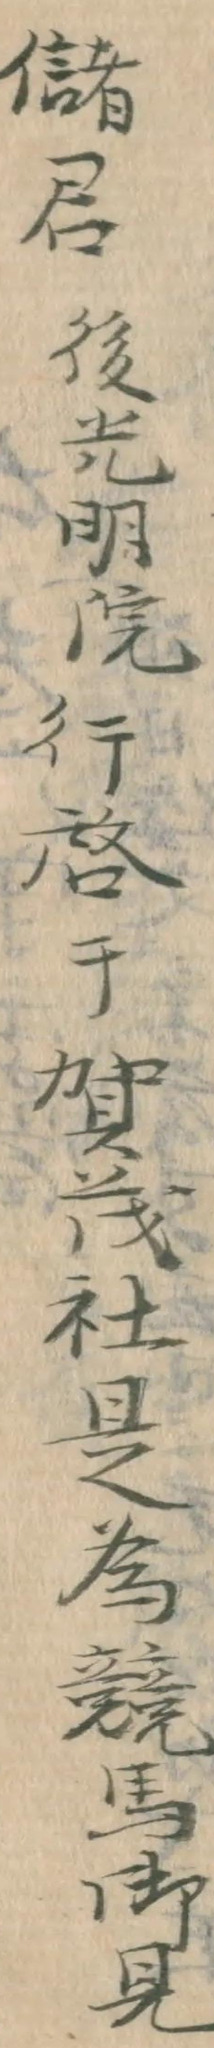儲君後光明院行啓于賀茂社是為競馬御見
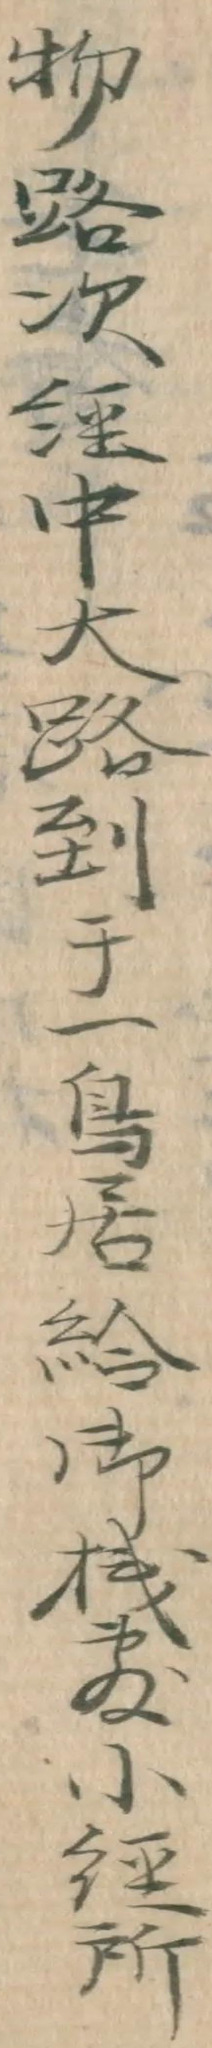物路次経中大路到于一鳥居給御桟敷小経所
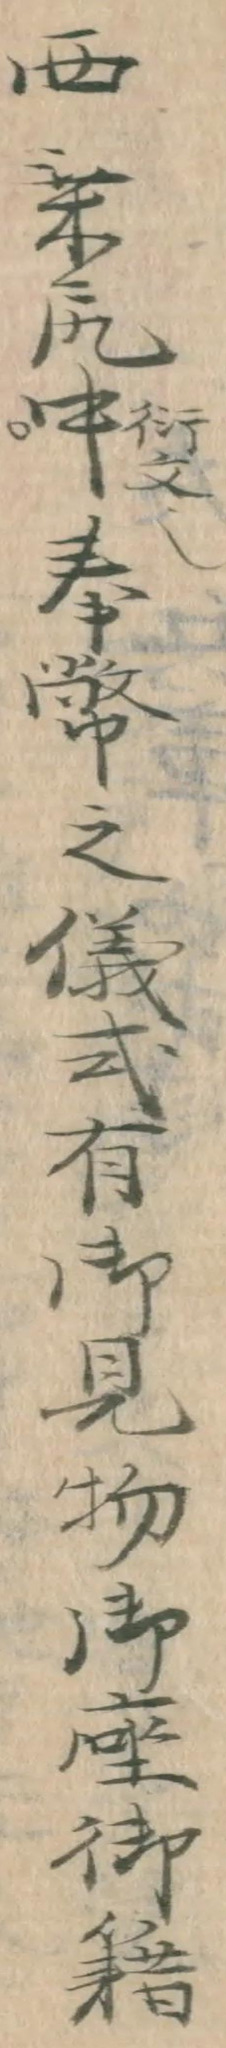西乗尻中奉幣之儀式有御見物御座御籍
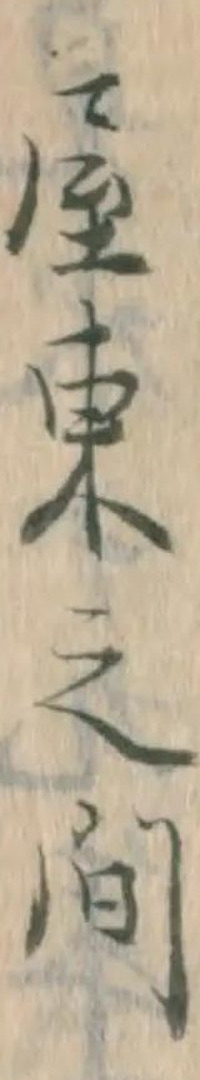屋東之間
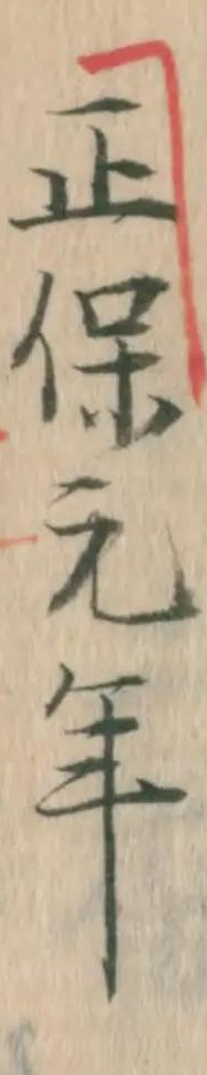正保二年
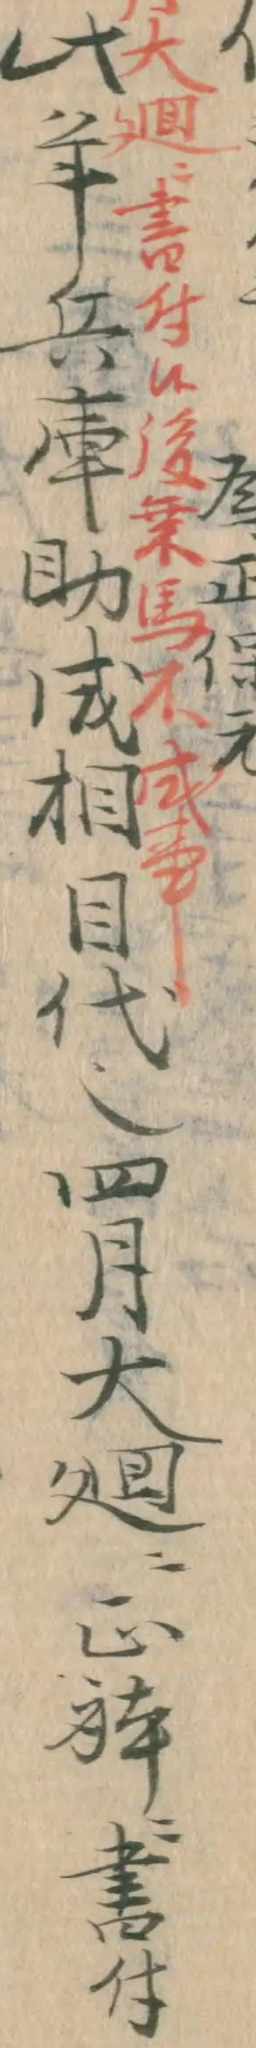此年兵庫助成相目代也四月大廻ニ正躰ニ書付
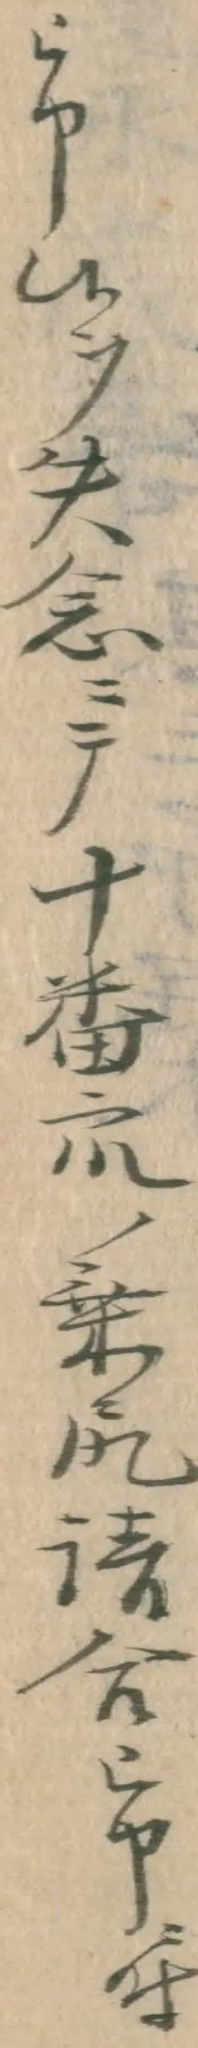被申候ヲ失念ニテ十番衆ノ乗尻請合被申ニ付
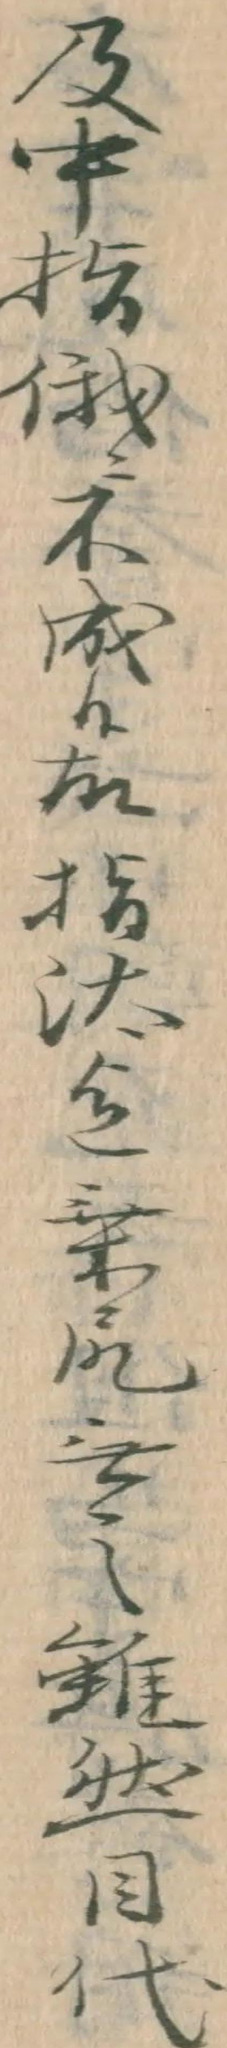及中指俄ニ不成候故指汰迄乗尻無之雖然目代
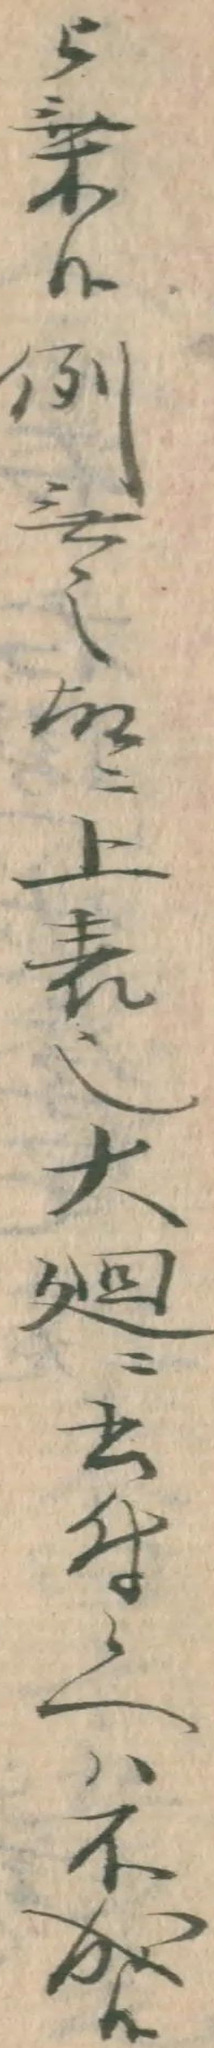被乗候例無之故ニ上表也大廻ニ書付候へハ不成候
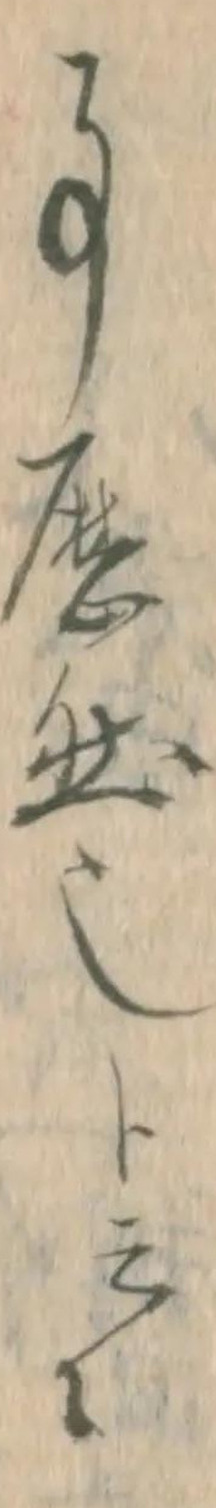事歴然也ト云々
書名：賀茂社記録. 第10冊
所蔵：国立国会図書館 National Diet Library, JAPAN
